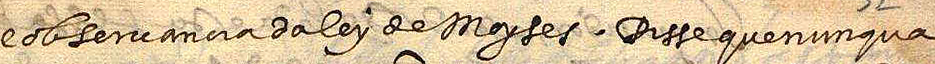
e obseruancia da ley de Moyses. Disse que nunqua
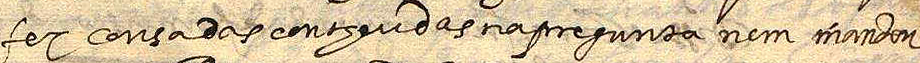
fez cousa das contheudas na pregunta nem mandou
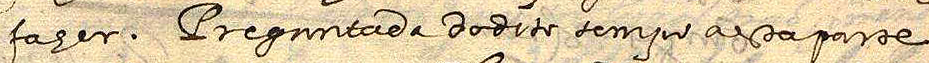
fazer. Preguntada do dito tempo a esta parte
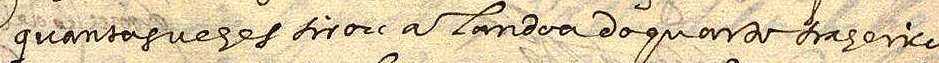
quantas uezes tirou a Landoa do quarto trazeiro
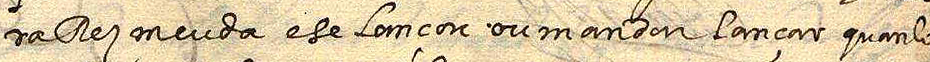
na Res meuda e se Lançou ou mandou Lançar quando
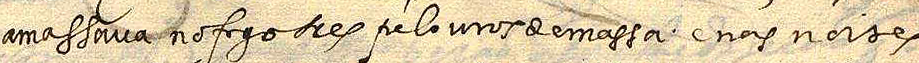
amassaua no fogo tres pelouros de massa. e nas noites
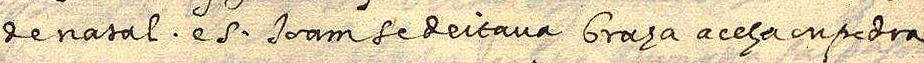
de natal. e s. Ioam se deitaua braza aceza em pedra
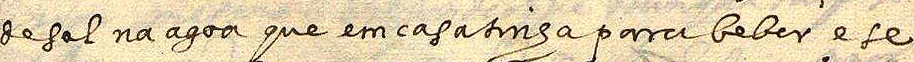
de sal na agoa que em casa tinha para beber e se
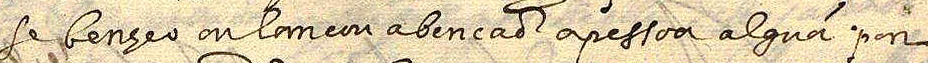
se benzeo ou lancou a bencaõ a pessoa alguā pon
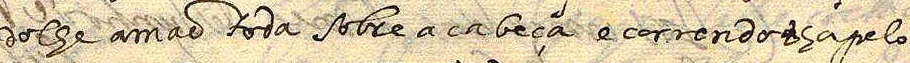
dolhe a maõ toda sobre a cabeça e correndolha pelo
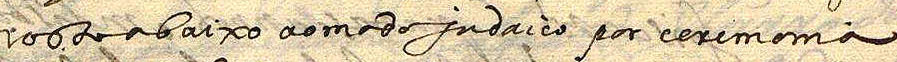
rosto abaixo ao modo judaico por ceremonia
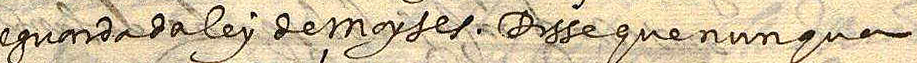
e guarda da ley de Moyses. Disse que nunqua
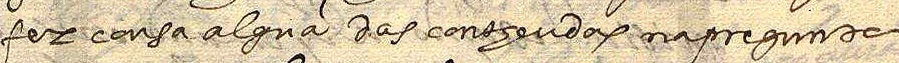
fez cousa alguā das contheudas na pregunta
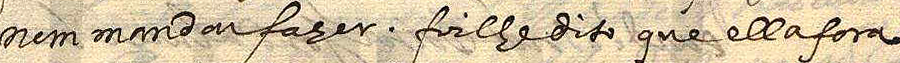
nem mandou fazer. foi lhe dito que ella fora
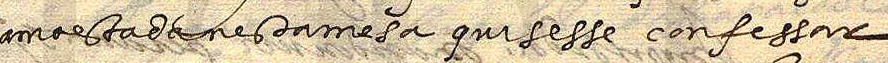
amoestada nesta mesa quisesse confessar
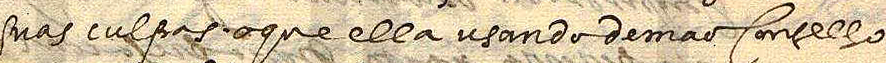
suas culpas. o que ella usando de mao Conselho
